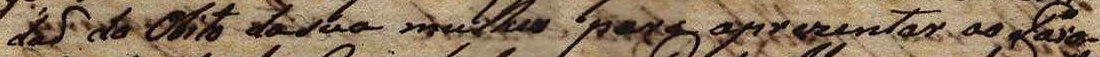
daõ do Obito da sua mulher para aprezentar ao Paro
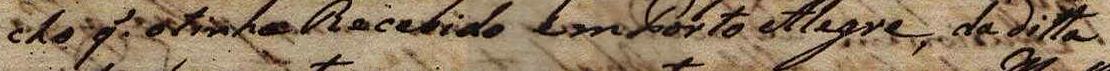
cho q̄ o tinha Recebido em Porto Alegre, da ditta
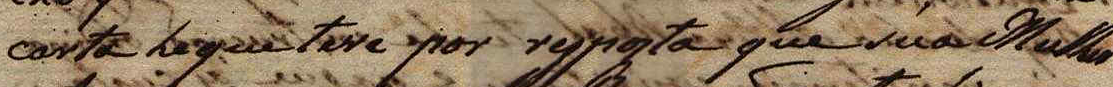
carta he que teve por resposta que sua Mulher
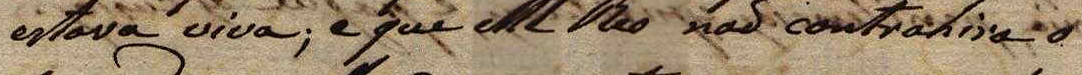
estava viva; e que elle Reo naõ contrahira o
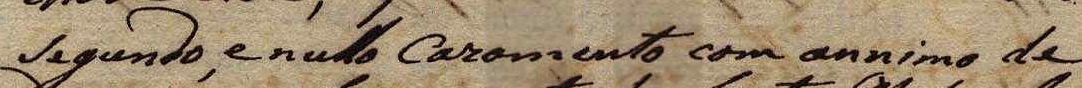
segundo, e nulo Cazamento com annimo de
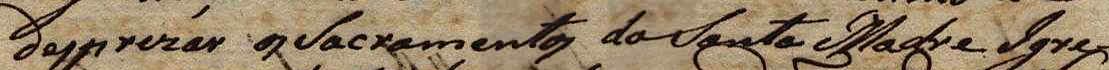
desprezar os sacramentos da Santa Madre Igreja
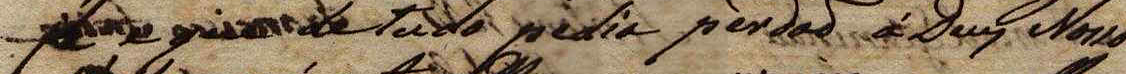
j_ e _ de tudo pedia perdaõ á Deus Nosso
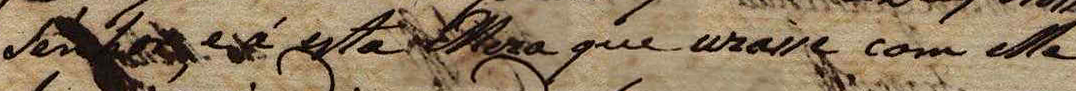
Senhor, e á esta Meza que uzasse com elle
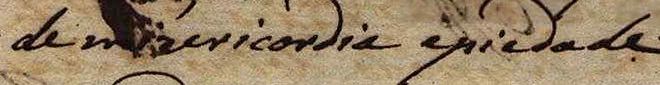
de mizericordia e piedade
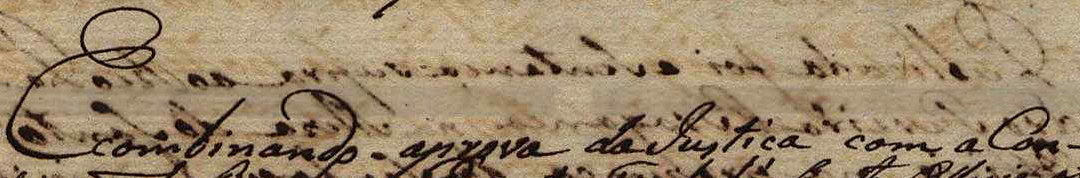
E combinando a prova da Justiça com a Con
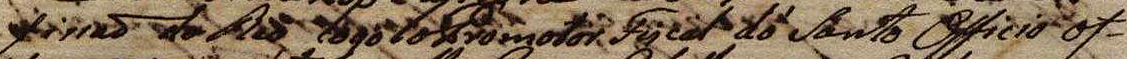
fissaõ do Reo, logo o Promotor Fiscal do Santo Officio of
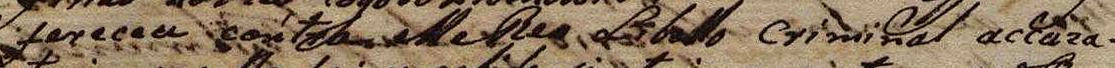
fereceu contra elle Reo Libello criminial accuza
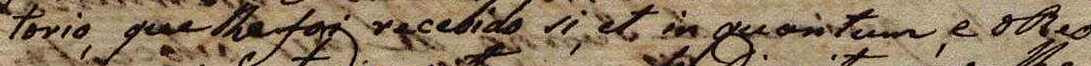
torio, que lhe foi recebido si, et in quantum, e o Reo
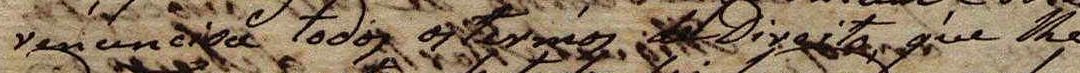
renunciou todos os termos de Direito, que lhe
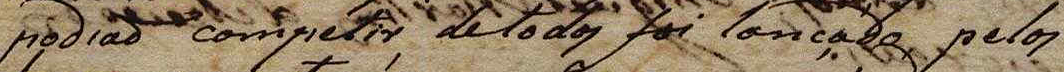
podiaõ competir, de todos foi lançado, pelos
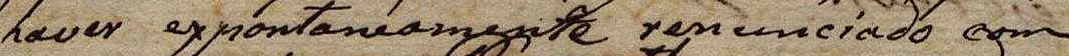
haver expontaneamente renunciado com
